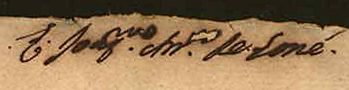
E. Joaq.m Ant.o de Loné.
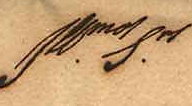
Jll.mos S.rs
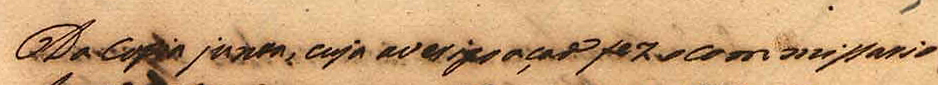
Da copia junta, cuja averigoaçaõ fez o commissario
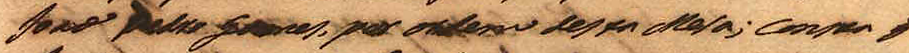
Joaõ Pedro gomes, por ordem desta Mesa; consta q̄
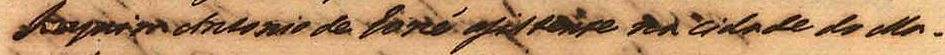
Ioaquim Antonio de Loné asistente na cidade do Ma
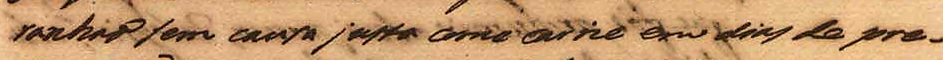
ranhaõ sem causa justa come carne em dias de pre
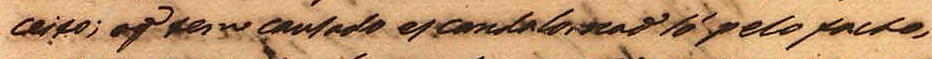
ceito; o q̄ tem causado escandalo, naõ só pelo facto,
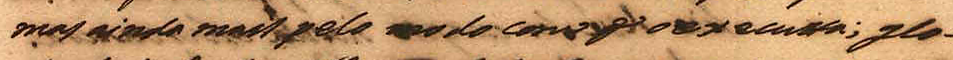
mas ainda mais pelo modo como q̄ o executta; glo
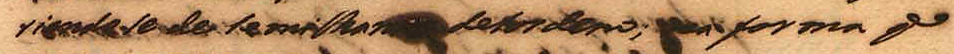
riandose de semilham_ desordem; na forma q̄
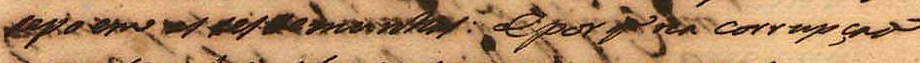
depoem as testemunhas: E porq̄ na corrupçaõ
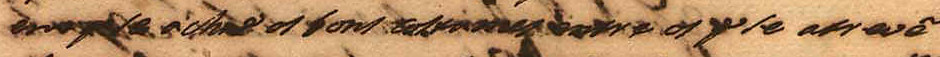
em que ach_ os bons costumes entre os q̄ se atrevē
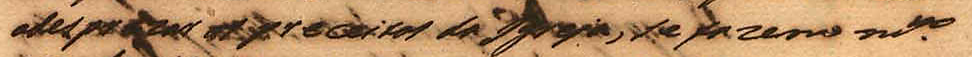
a desprezar os preceitos da Igreja, se fazem m.to
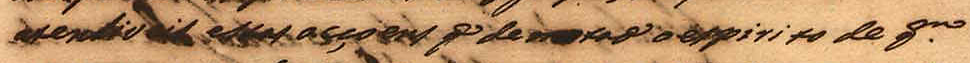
atendiveis estas acçoens q̄ denotaõ o espirito de q.m
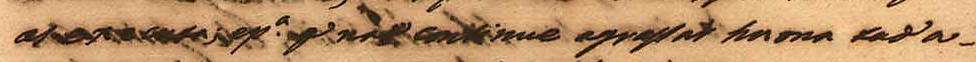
as execusa, e p.a q̄ naõ continue a grassar huma taõ a
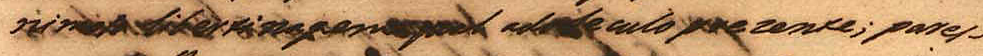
nimada libertinagem qual a do seculo prezente; pares
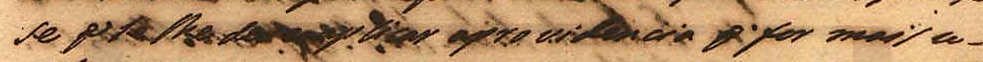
se q̄ se lhe de_ _plicar a providencia q̄ for mais u
